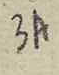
3A
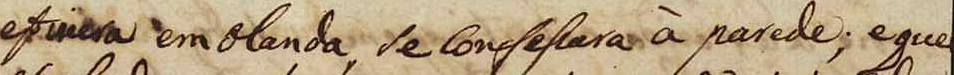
estiuera em olanda, se confessara à parede; e que
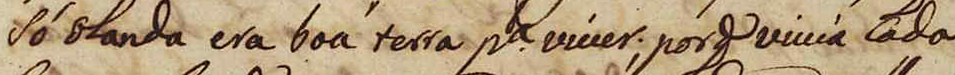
só olanda era boa terra p.a viuer; porq̄ viuia cada
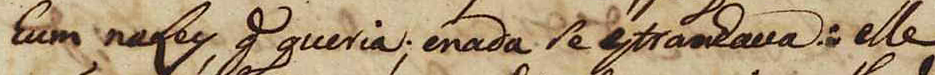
hum na Ley, q̄ queria: e nada se estranhaua; elle
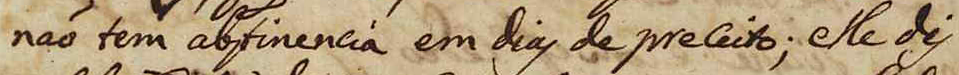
naõ tem abstinencia em dias de preceito; ele dis
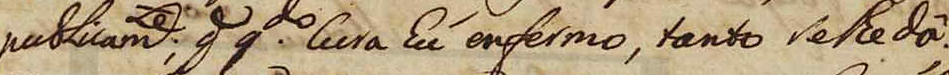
publicam.te q̄ q.do Cura hū enfermo, tanto se lhe dá;
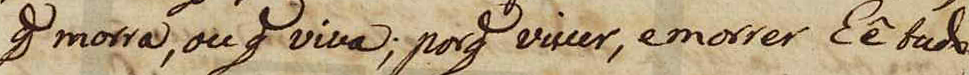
q̄ morra, ou q̄ viva; porq̄ viuer, e morrer hé tudo
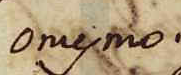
o mesmo.
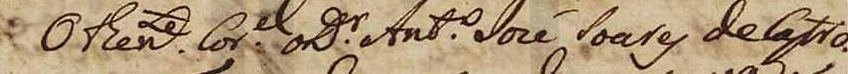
O then.te Cor.el o D.r Ant.o Iozé soares de Castro;
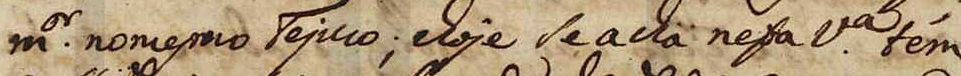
m.or no mesmo Tejuco; e hoje se acha nesta V.a tem
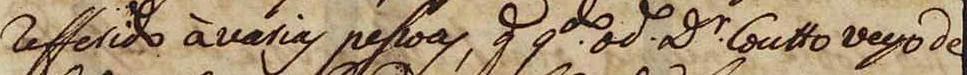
Refferido à várias pessoas, q̄ q.do o d.o Dr. Coutto veyo de
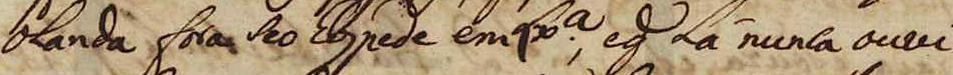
olanda fora seo hospede em Lx.a, e q̄ lá nunca ouvi
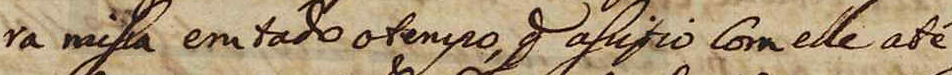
ra missa em todo o tempo, q̄ assitio com elle até
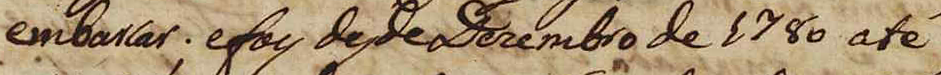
embarcar; e foy desde Dezembro de 1780 até
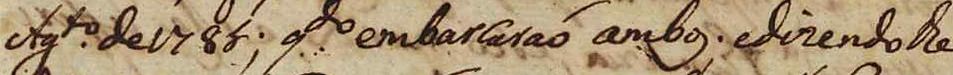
Ag.to de 1784; q.do embarcaraõ ambos; e dizendolhe
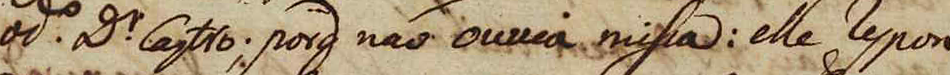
o d.o D.r Castro; porq̄ naõ ouuia missa: elle Respon
